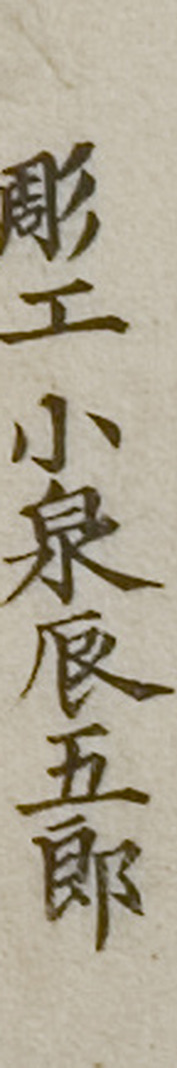彫工小泉辰五郎
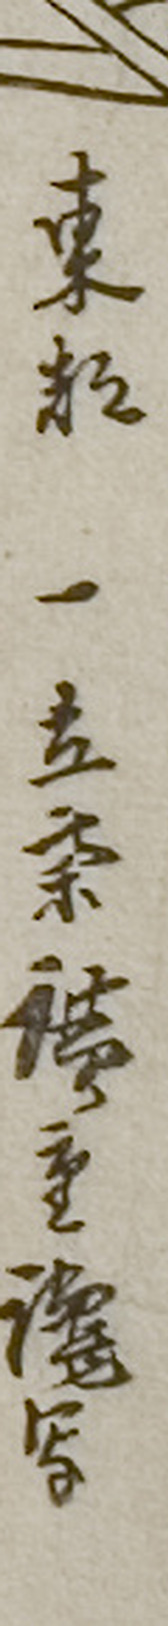東都一立斎広重謹写
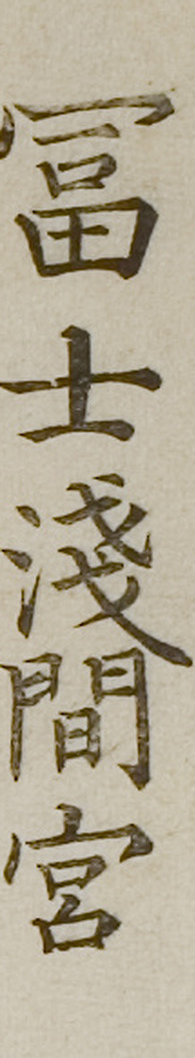富士浅間宮
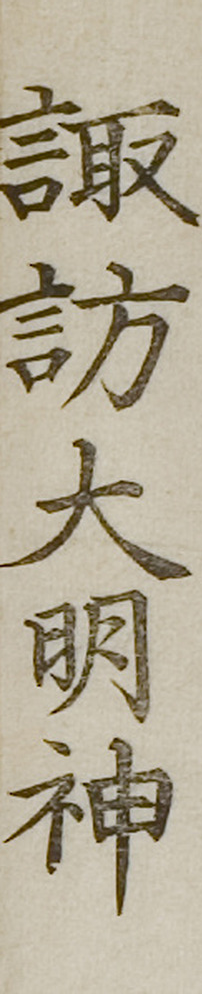諏訪大明神
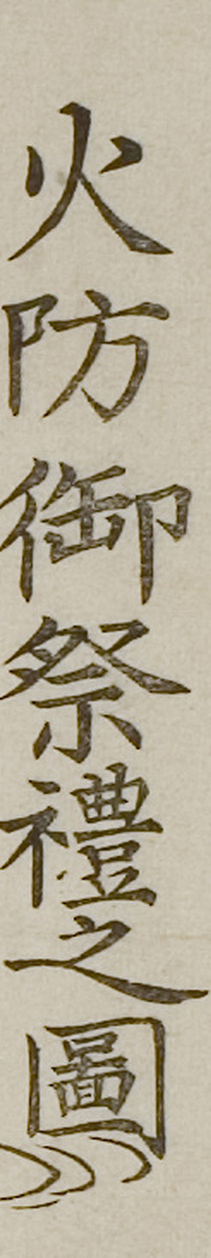火防御祭礼之図
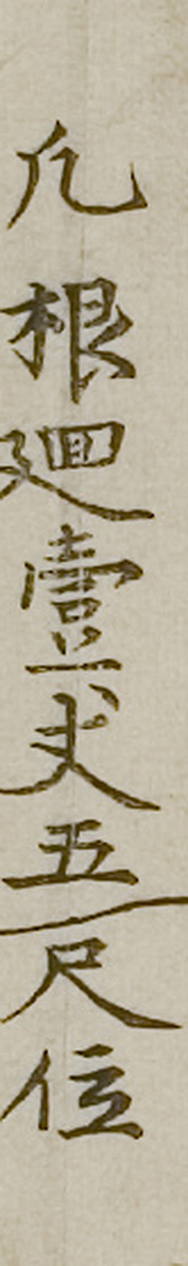篝凡根廻壱丈五尺位
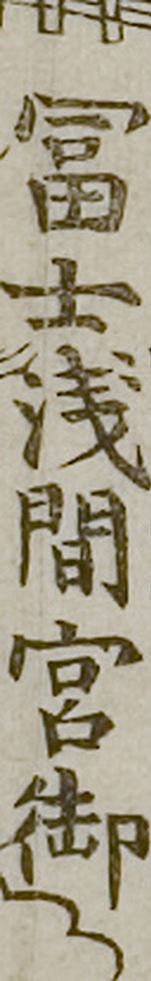富士浅間宮
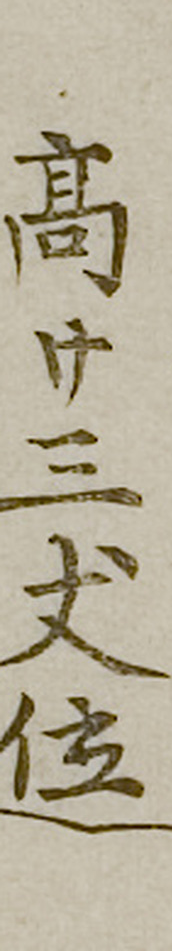高サ三丈位
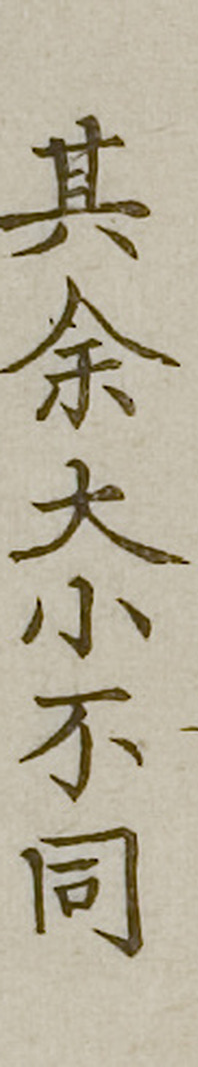其余大小不同
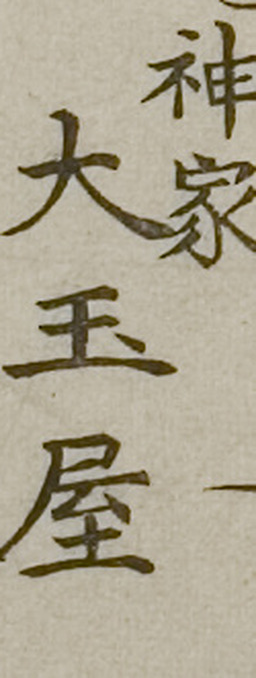大玉屋
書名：[富士浅間宮 諏訪大明神 火防御祭礼之図]
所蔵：東京大学総合図書館 General Library in the University of Tokyo, JAPAN
